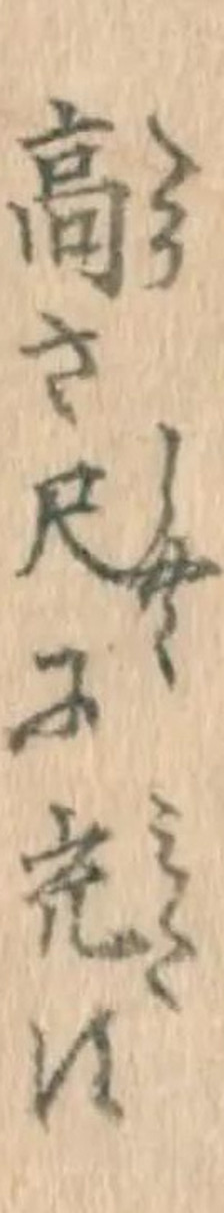高さ尺に充す
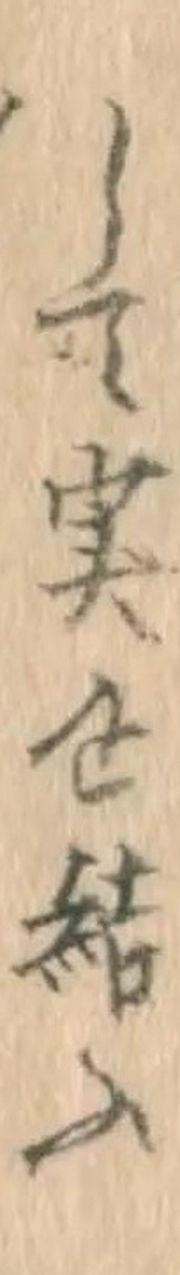して実を結ふ
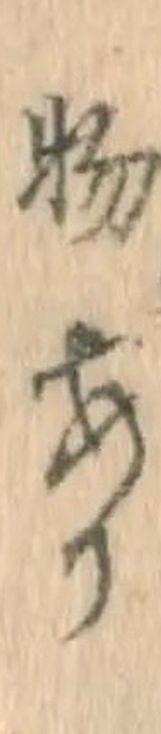物あり

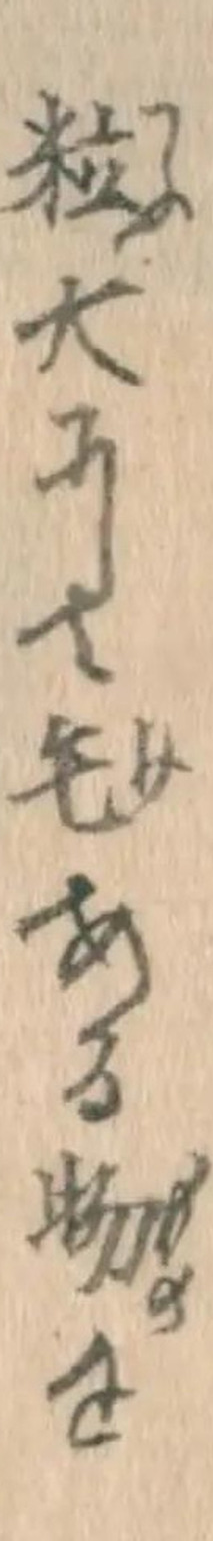粒大にして毛ある物を
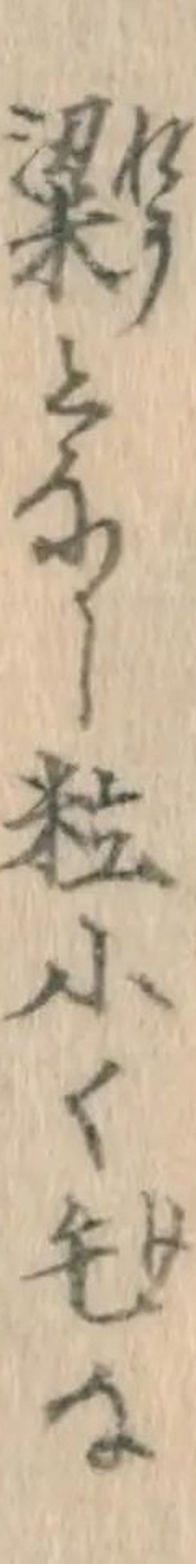粱となし粒小く毛な
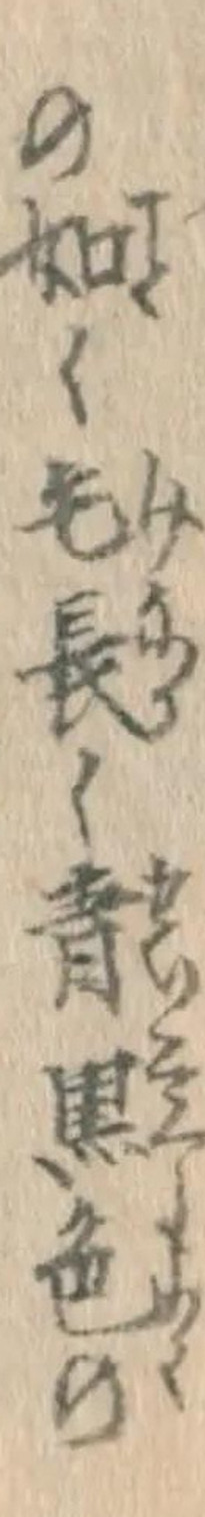の如く毛長く青黒色の
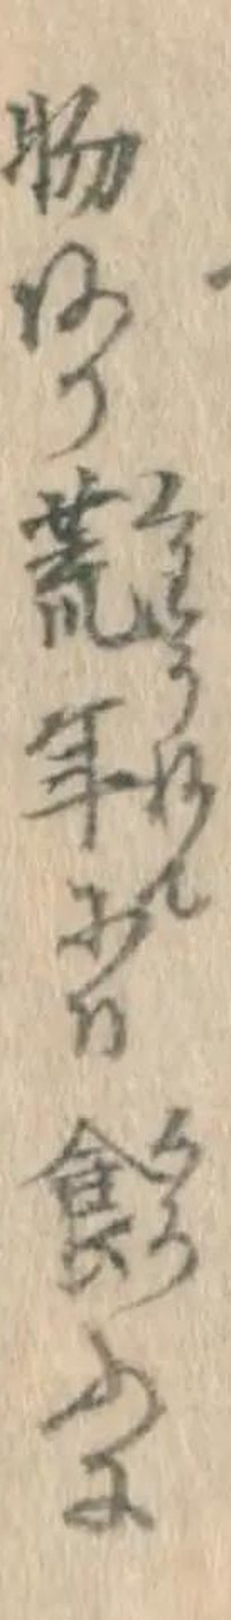物あり荒年には食ふに
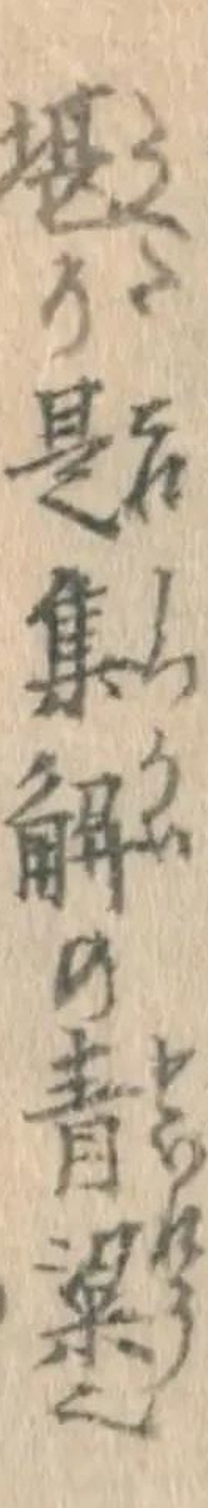堪り是集解の青粱也
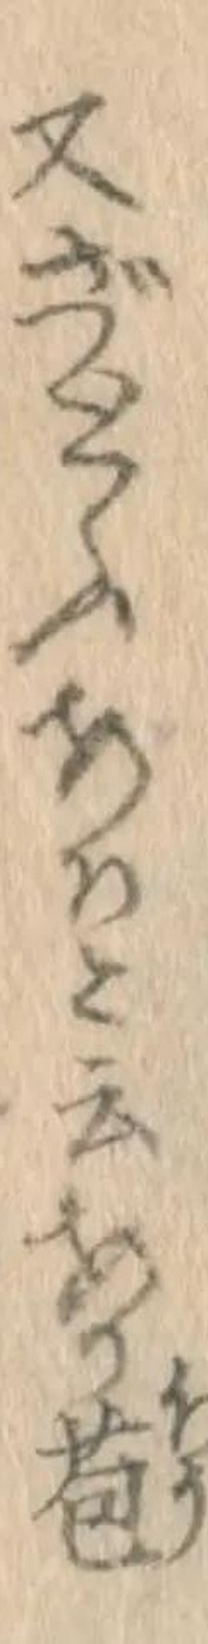又ざとふあはと云あり苞
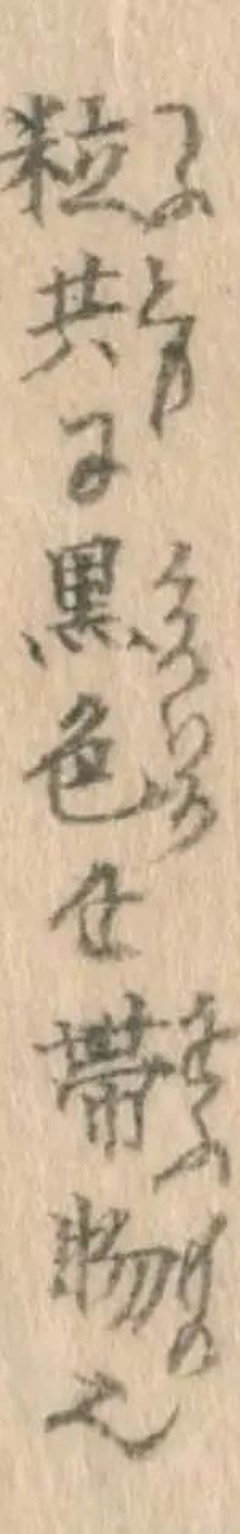粒共に黒色を帯物也

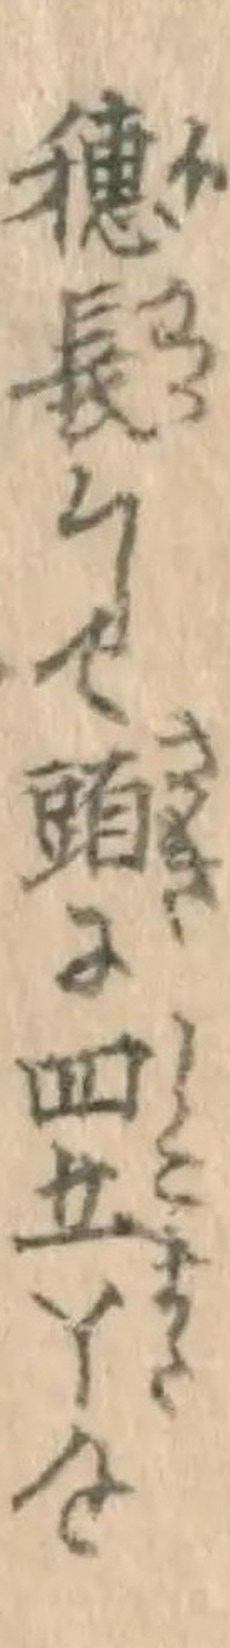穂長くして頭に四五丫を
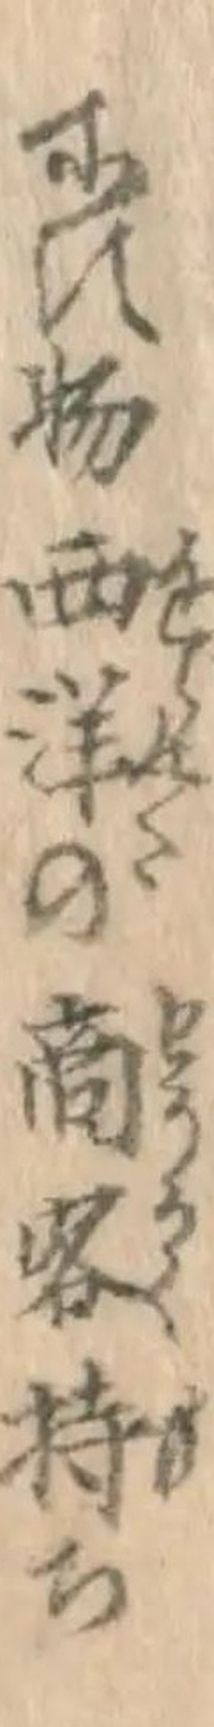なす物西洋の商客持ち
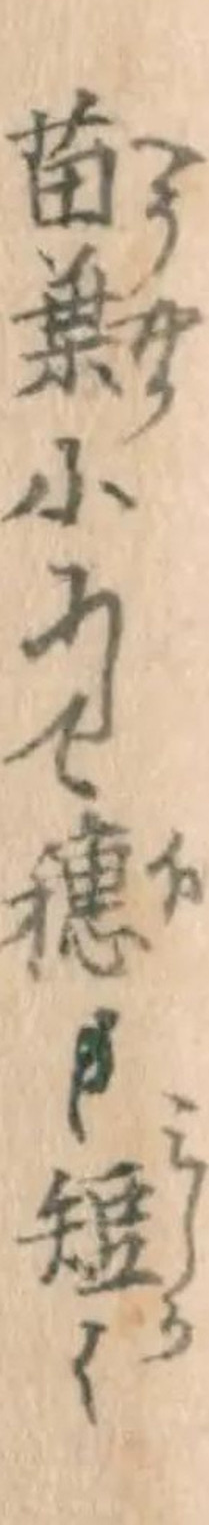苗葉小にして穂も短く
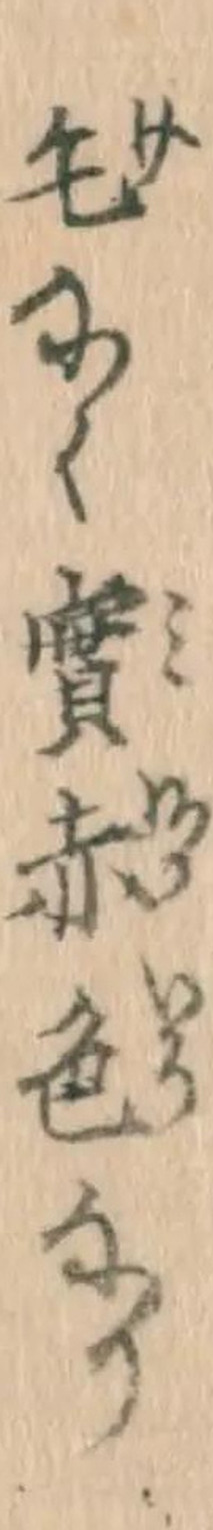毛なく実赤色なり

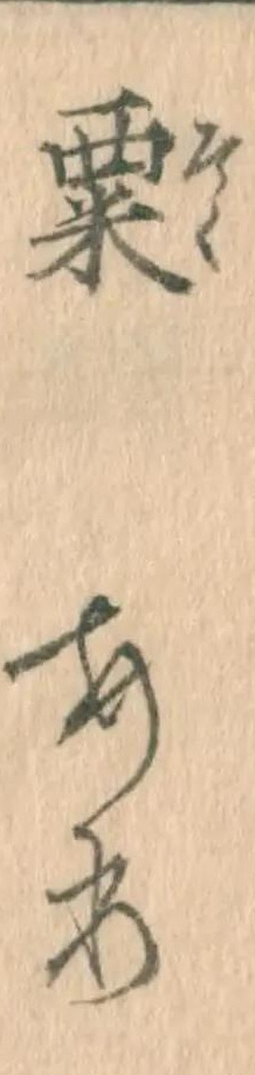粟あわ
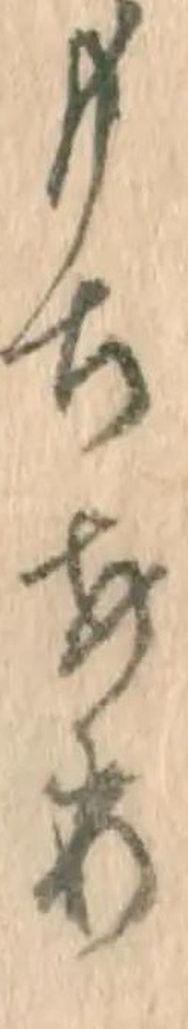もちあわ
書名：本草図譜. 巻40-42
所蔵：国立国会図書館 National Diet Library, JAPAN
